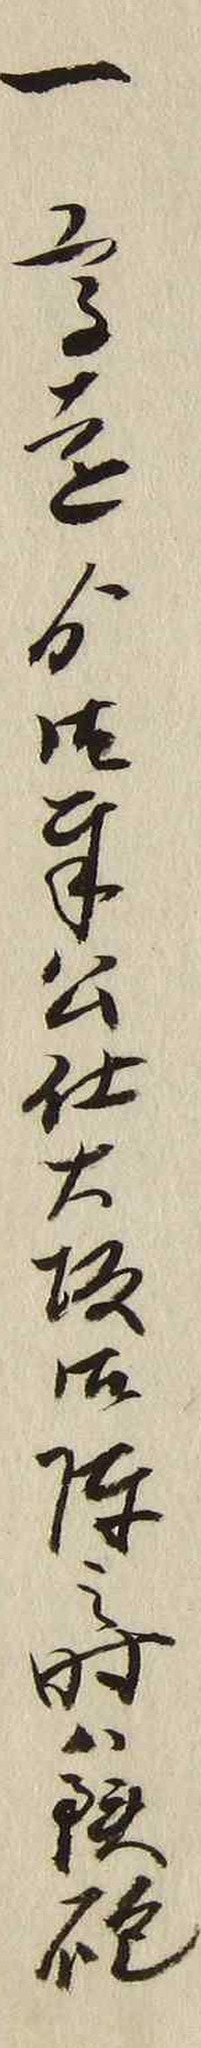一高遠ゟ御奉公仕大坂御陣之時ハ鉄砲
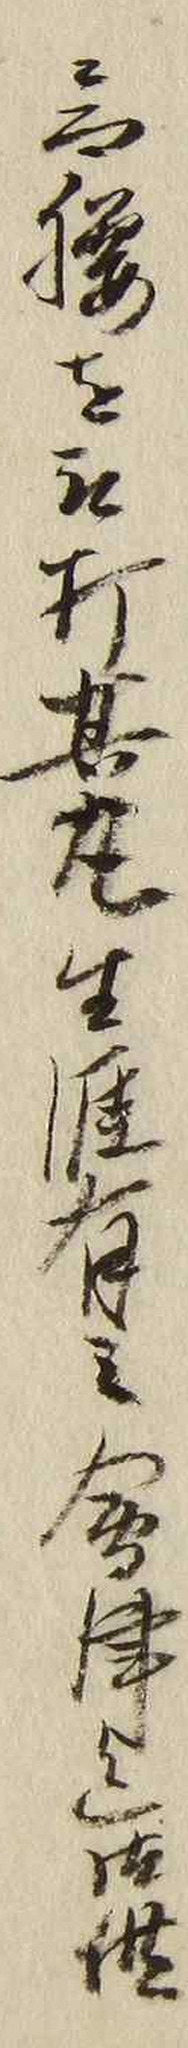ニ而腰を被打其丸生涯有之会津迄御供

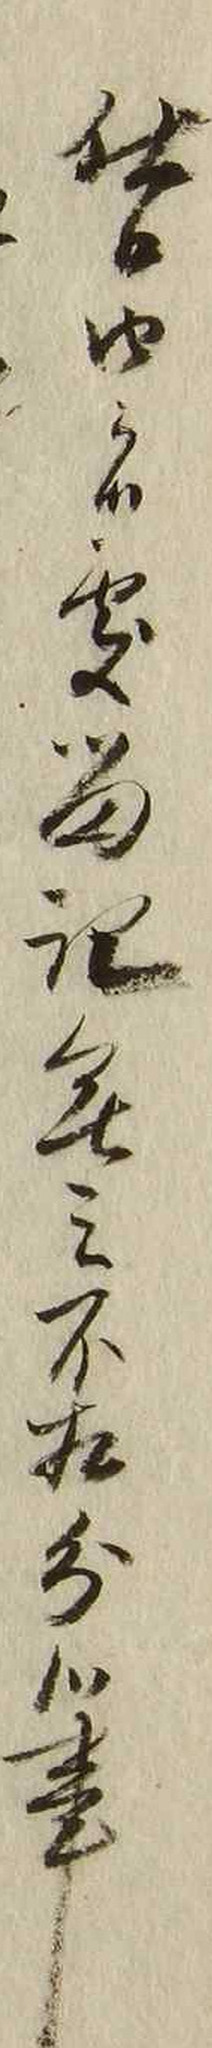仕候由ニ候処留記無之不相分候事
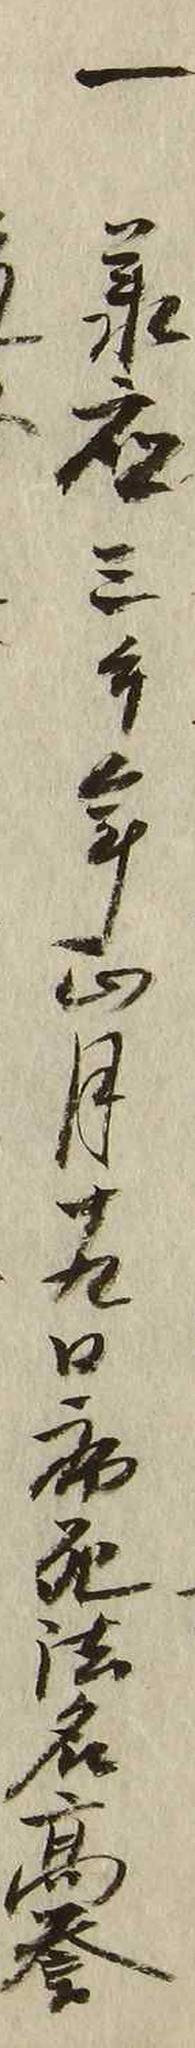一承応三午年正月十九日病死法名高誉
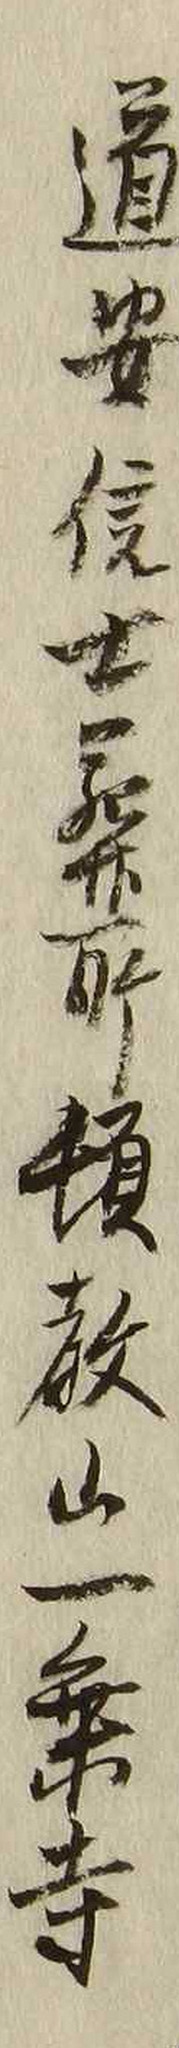道安信士葬所頓教山一乗寺
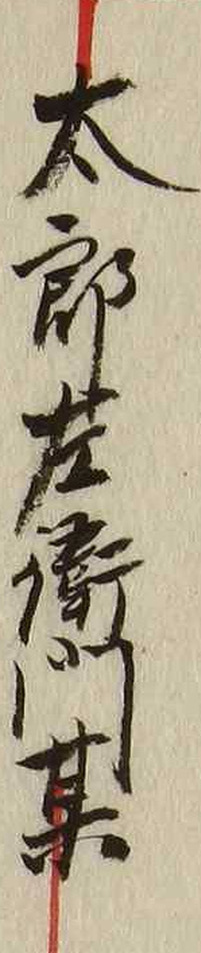太郎左衛門某
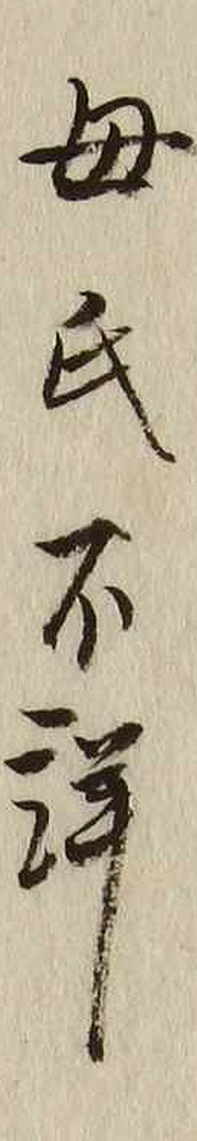母氏不詳
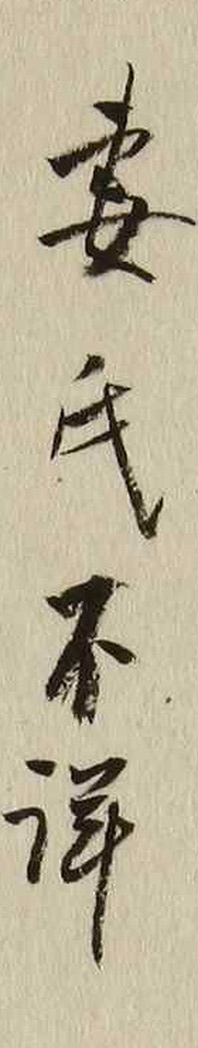母氏不詳
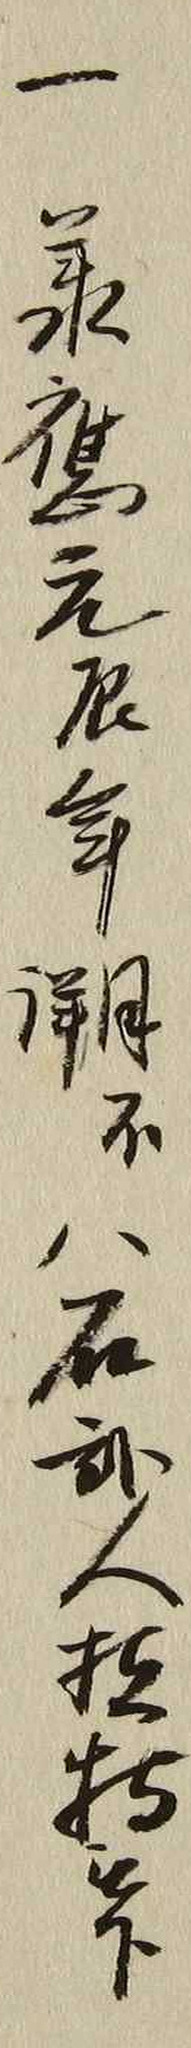一承応元辰年月不詳八石弐人扶持被下
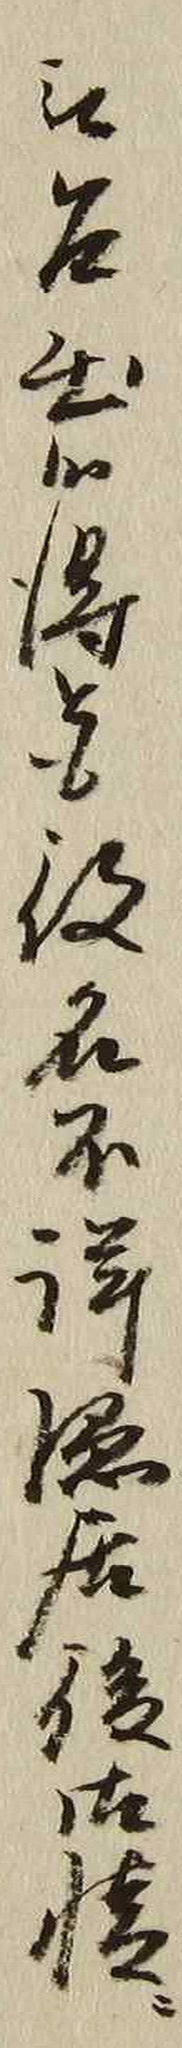被召出候得とも役名不詳隠居後御情ニ
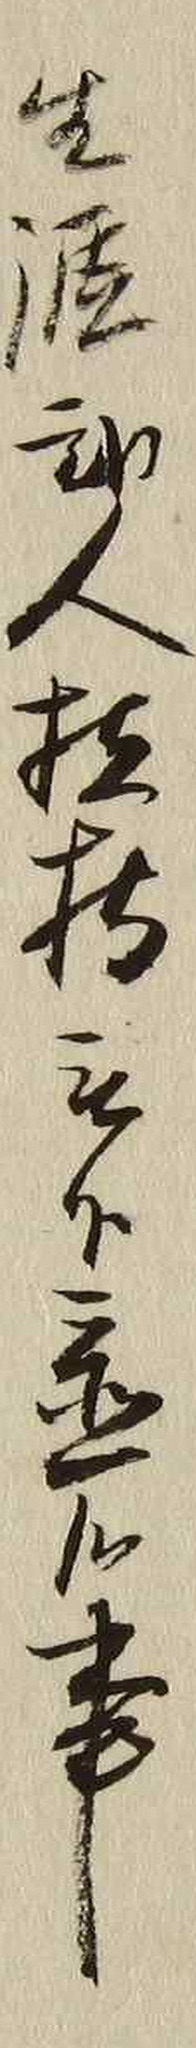生涯弐人扶持被下置候事
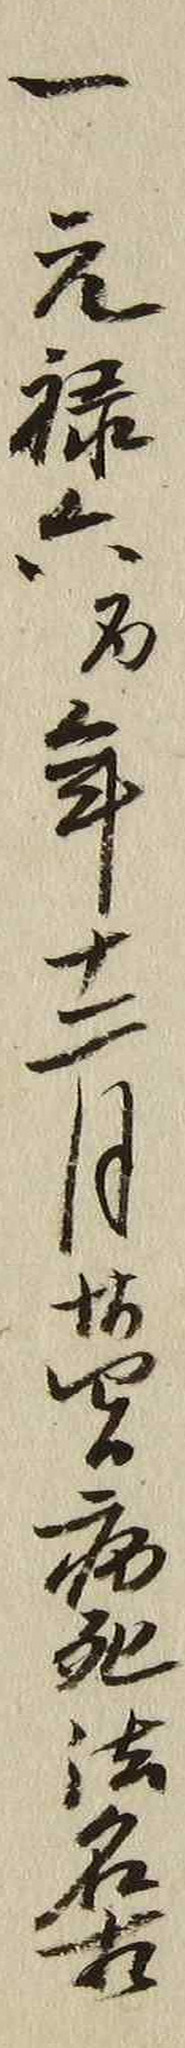一元禄六酉年十二月廿四日病死法名相
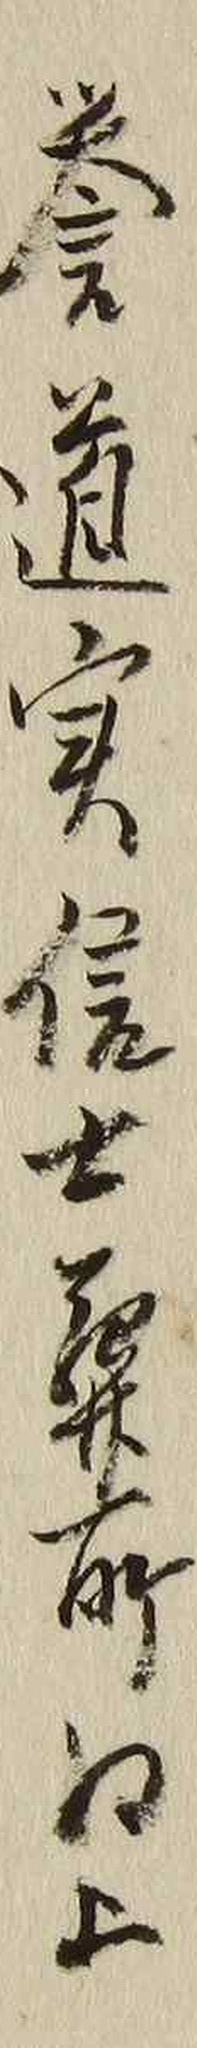誉道実信士葬所同上
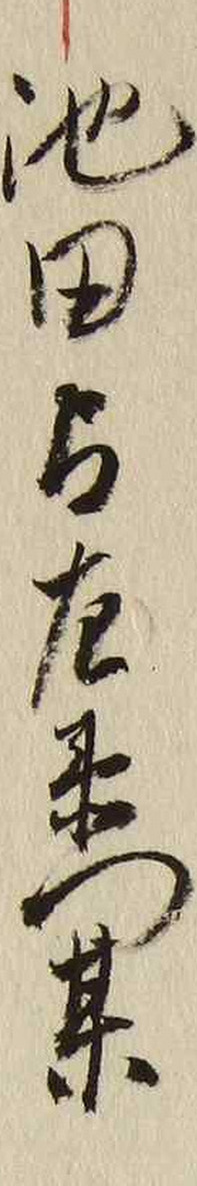池田与左衛門某
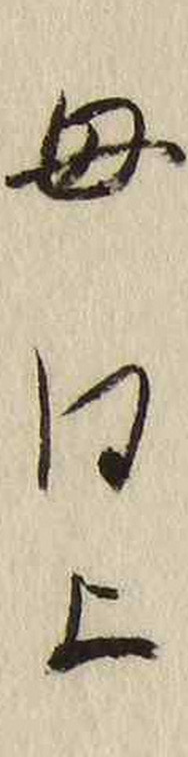母同上

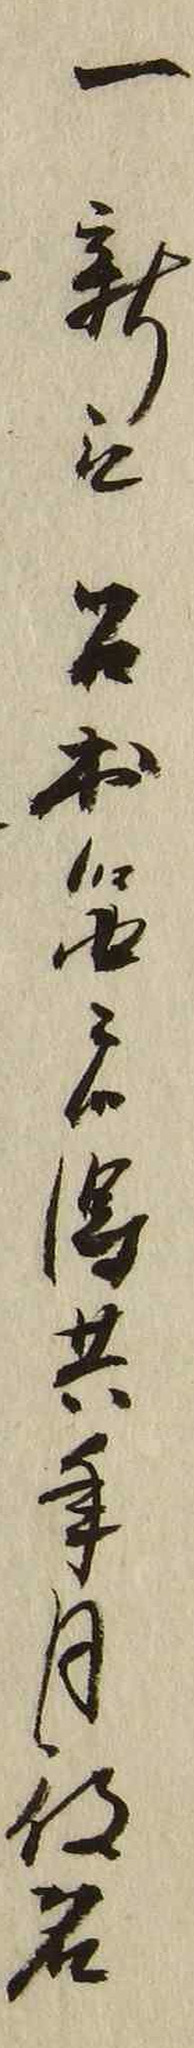一新被召出候由ニ候得共年月役名
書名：諸士系譜　巻之349　も之部5
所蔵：会津若松市立会津図書館
